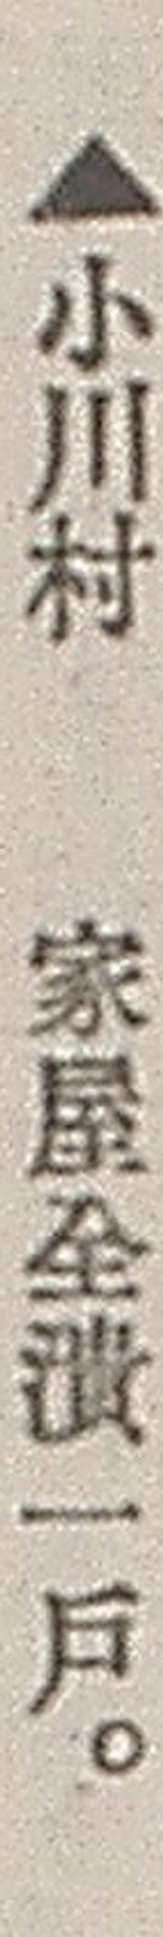▲小川村家屋全潰一戸。
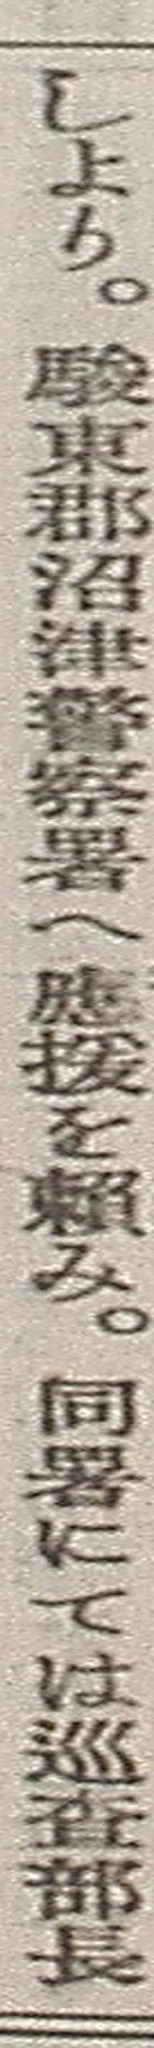しより。駿東郡沼津警察署へ応援を頼み。同署にては巡査部長
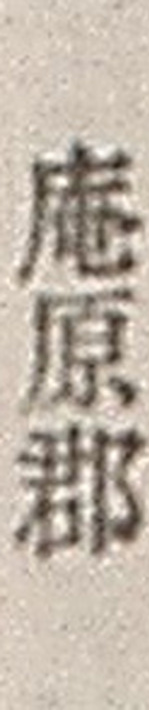庵原郡
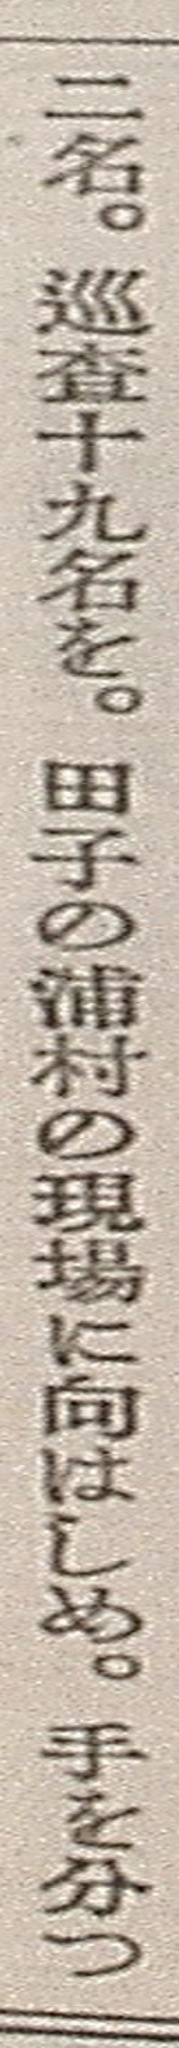二名。巡査十九名を。田子の浦村の現場に向はしめ。手を分つ

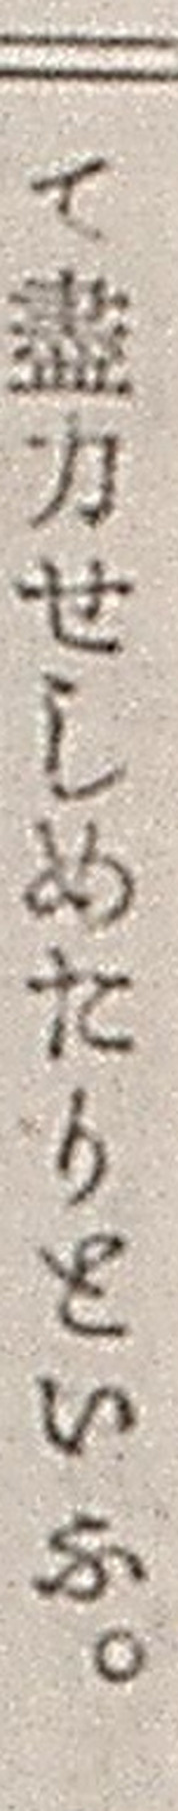て尽力せしめたりといふ。
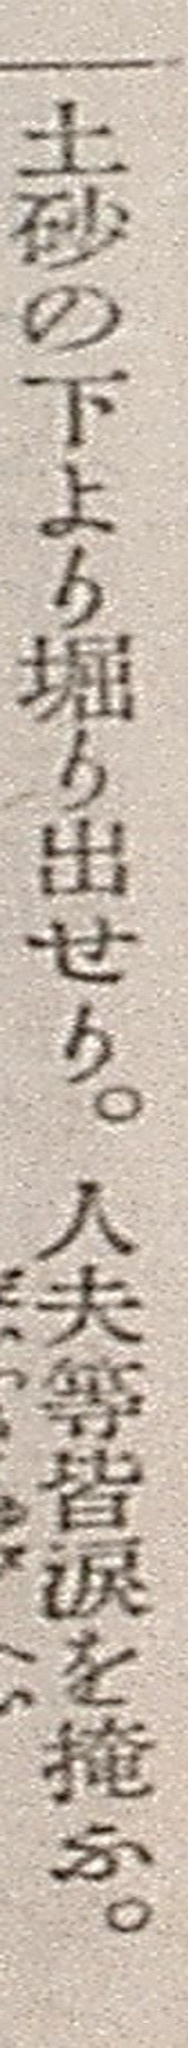土砂の下より堀り出せり。人夫等皆涙を掩ふ。
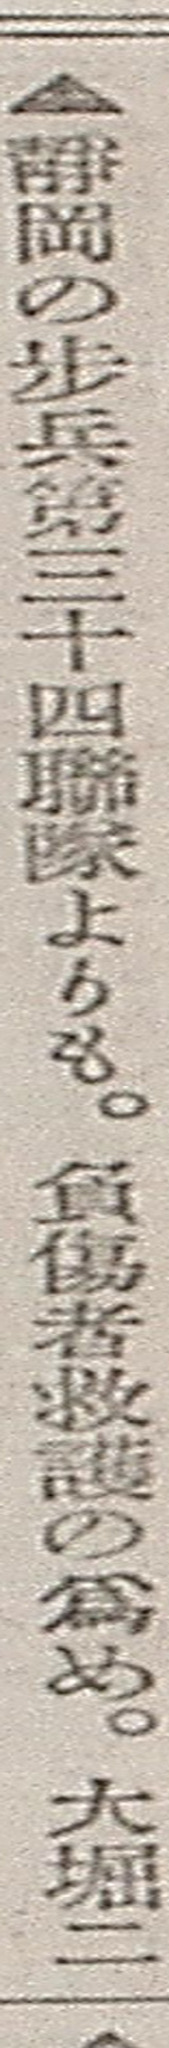▲静岡の歩兵第三十四連隊よりも。負傷者救護の為め。大堀二
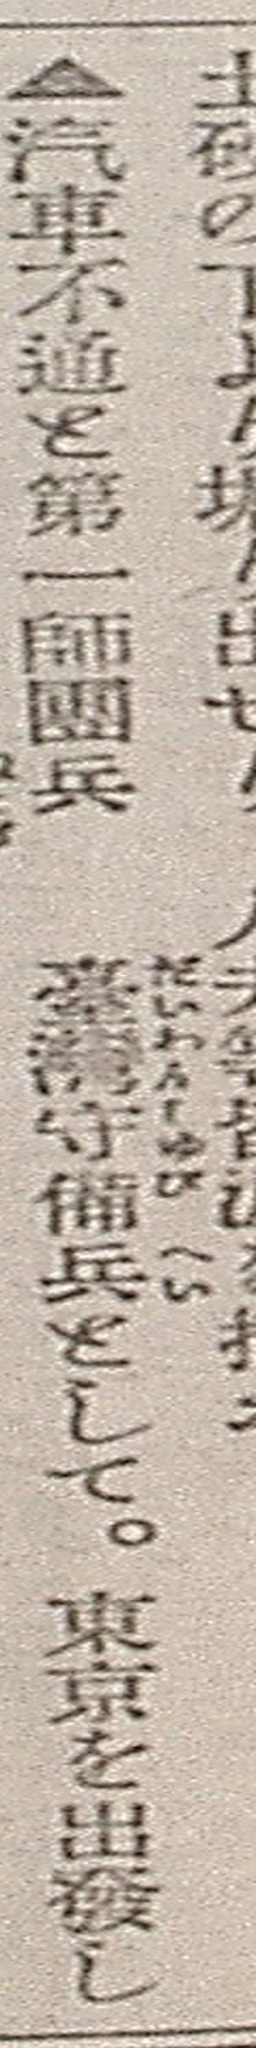▲汽車不通と第一師団兵台湾守備兵として。東京を出発し
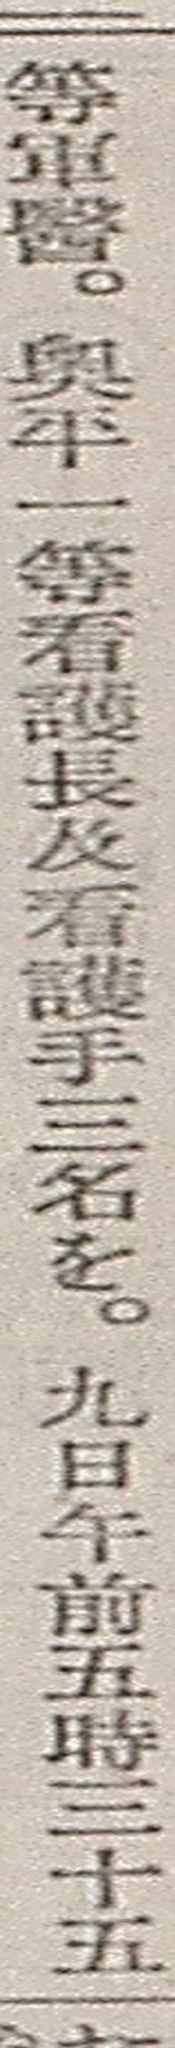等軍医。奥平一等看護長及看護手三名を。九日午前五時三十五
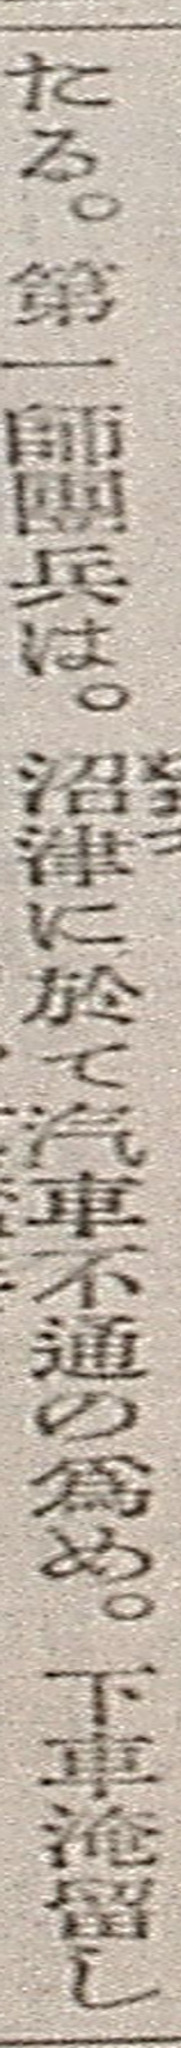たる。第一師団兵は。沼津に於て汽車不通の為め。下車淹留し
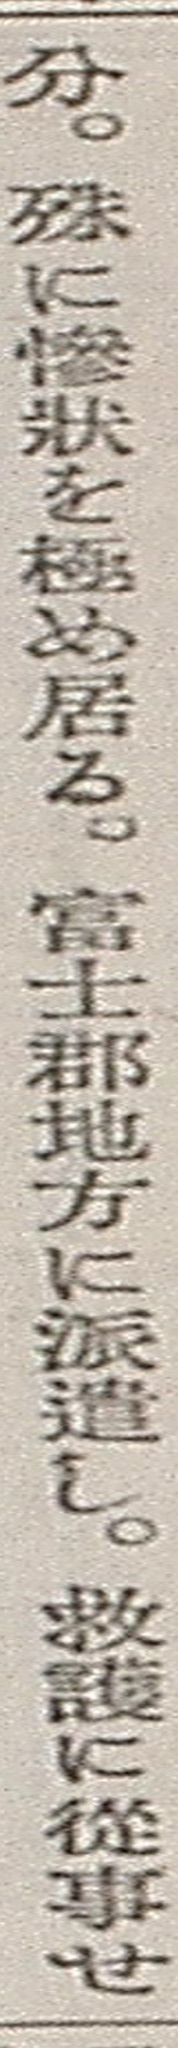分。殊に惨状を極め居る。富士郡地方に派遣し。救護に従事せ
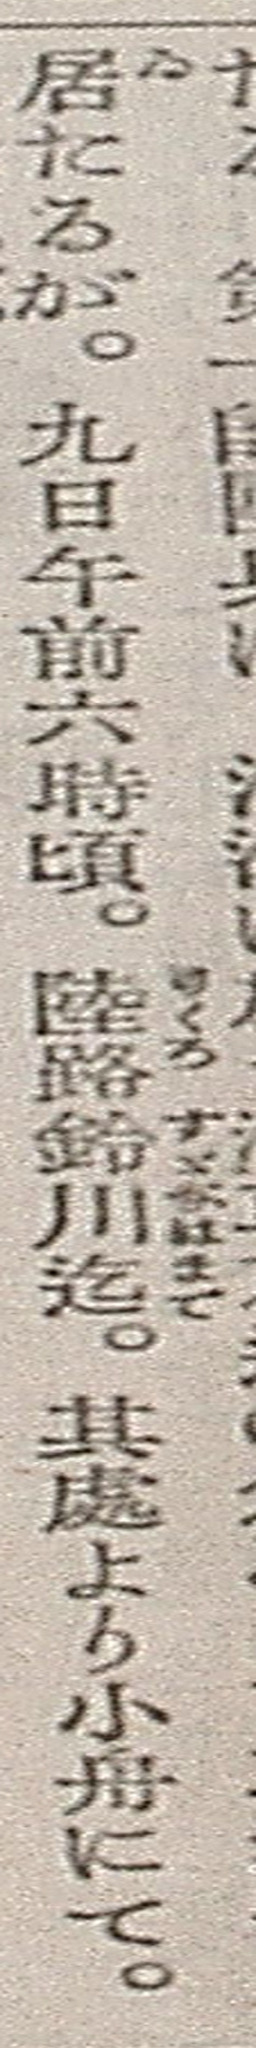居たるが。九日午前六時頃。陸路鈴川迄。其処より小舟にて。
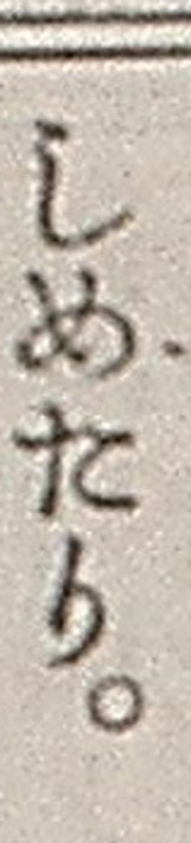しめたり。
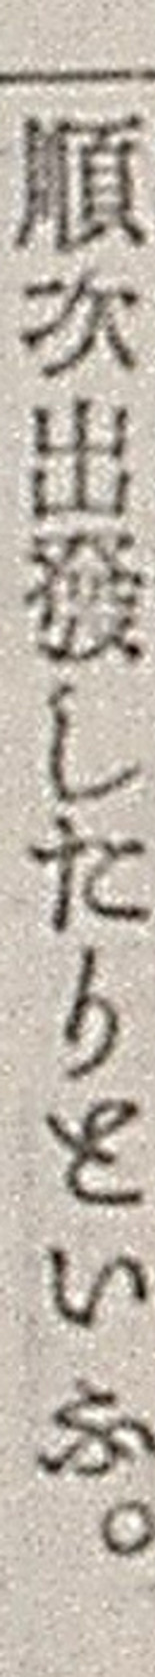順次出発したりといふ。
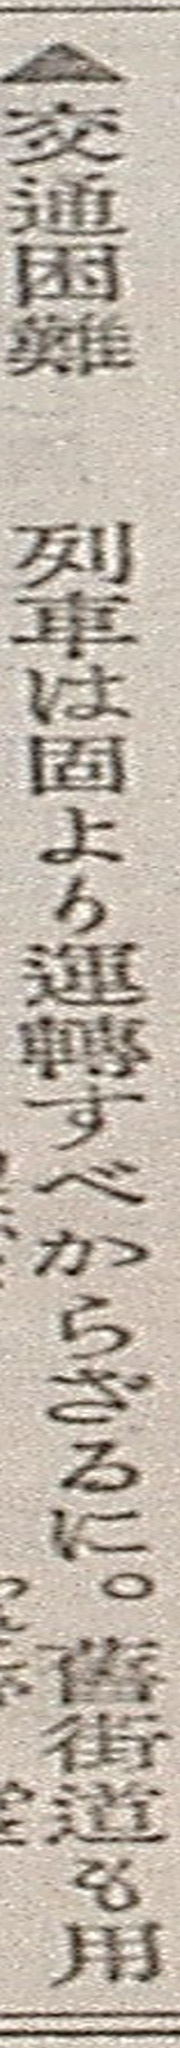▲交通困難列車は固より運転すべからざるに。旧街道も用
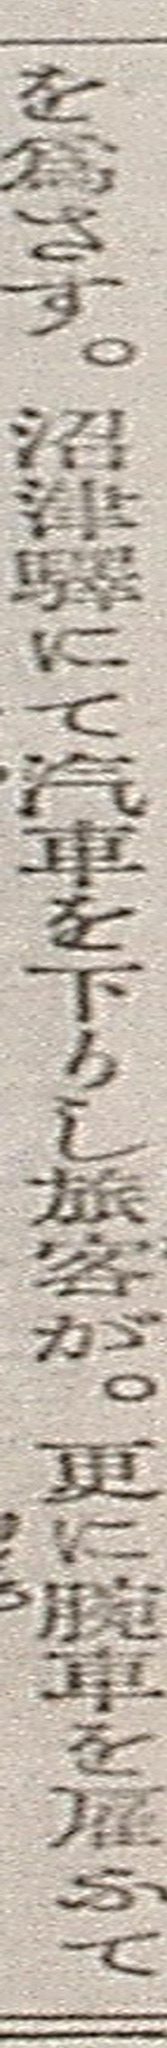を為さす。沼津駅にて汽車を下りし旅客が。更に腕車を雇ふて
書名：風俗畫報臨時増刊第百九十九號　明治三十二年十月各地災害圖會（前編之續）
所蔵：東京大学地震研究所図書室 Earthquake Research Institute Library, The University of Tokyo, JAPAN
